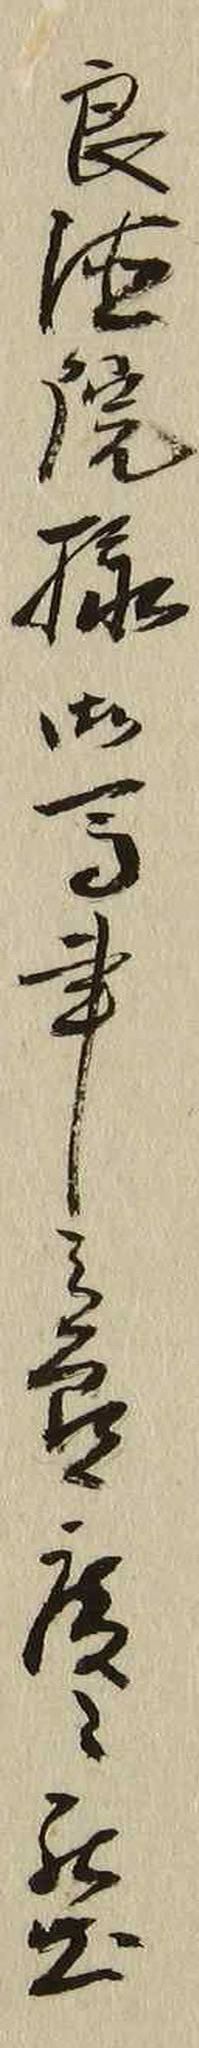良徳院様御馬事之節度々罷出
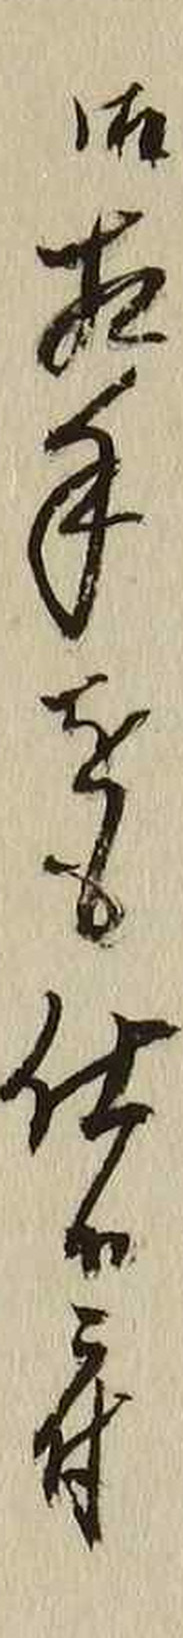御相手をも仕候ニ付
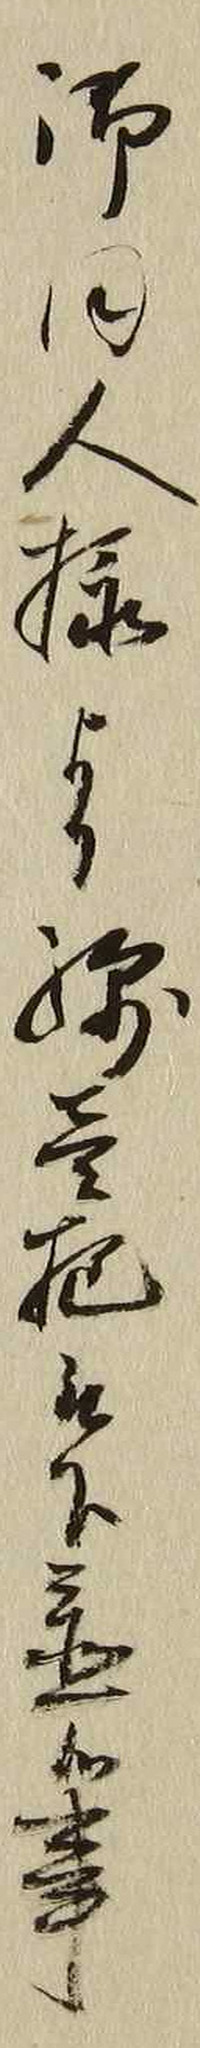御同人様より綿壱把被下置候事
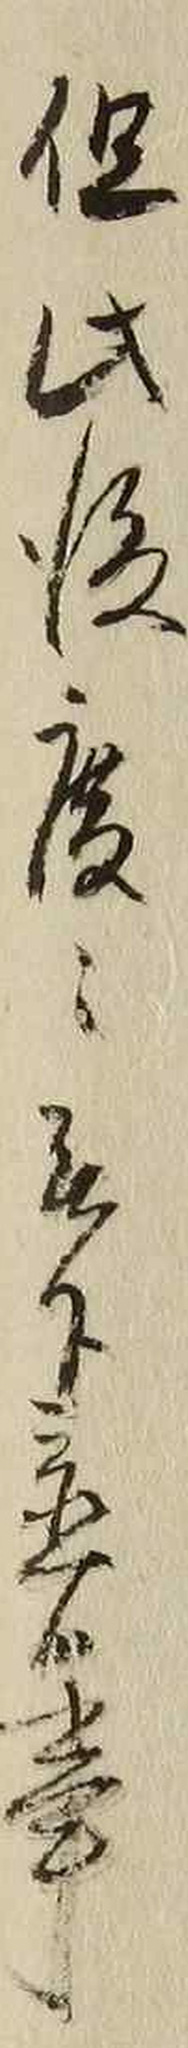但此後度々被下置候事
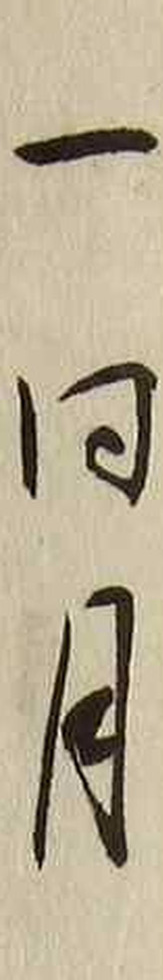一同月
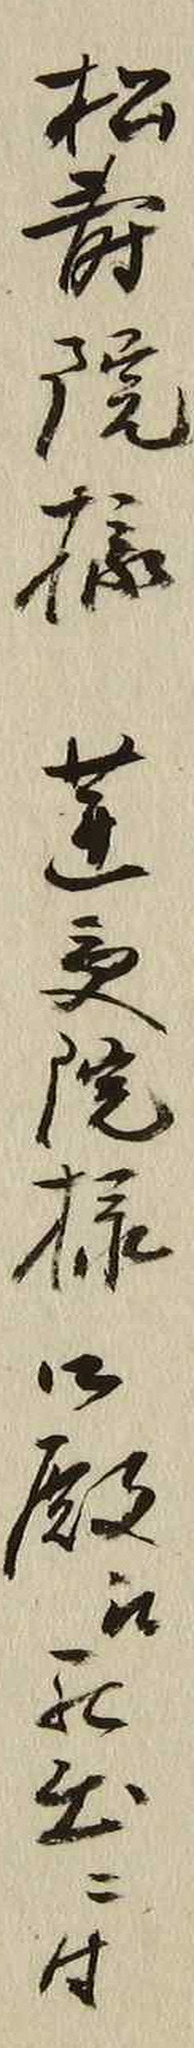松寿院様蓮受院様御殿江罷出ニ付
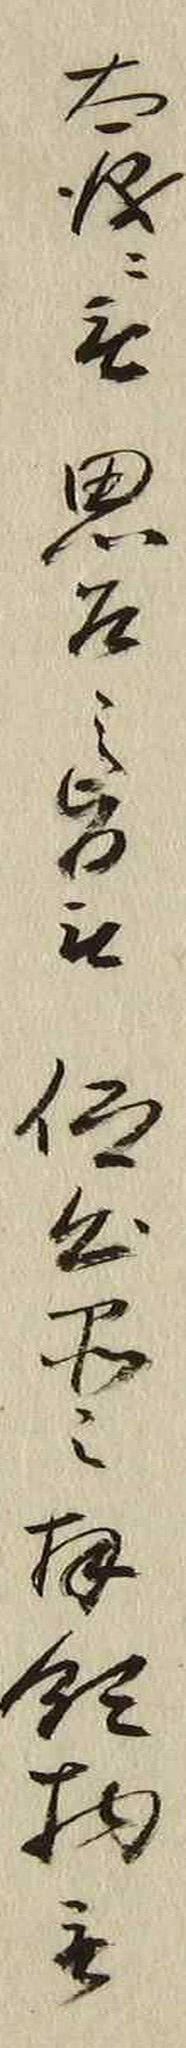太儀ニ被思召之旨被仰出品々拝領物被
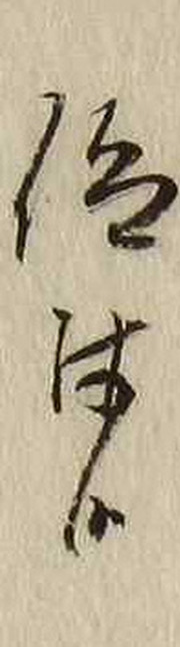仰付候
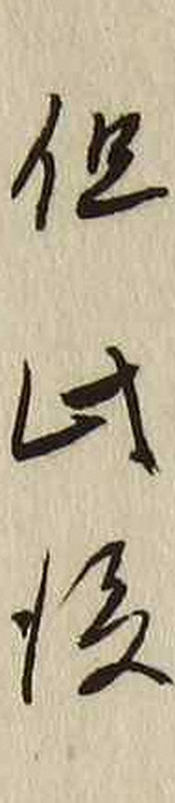但此後
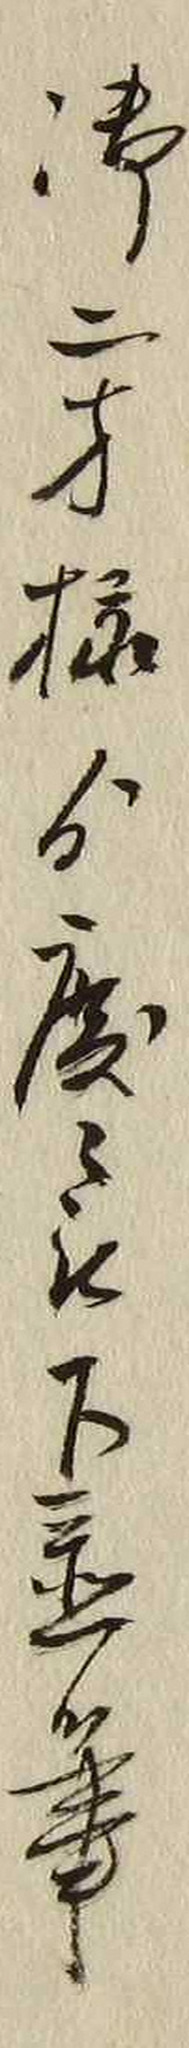御二方様ゟ度々被下置候事
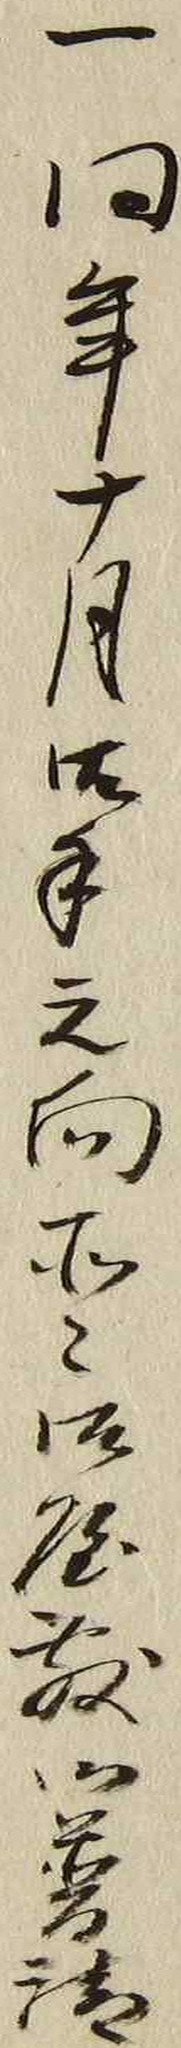一同年十月御手元向所々御屋敷御普請
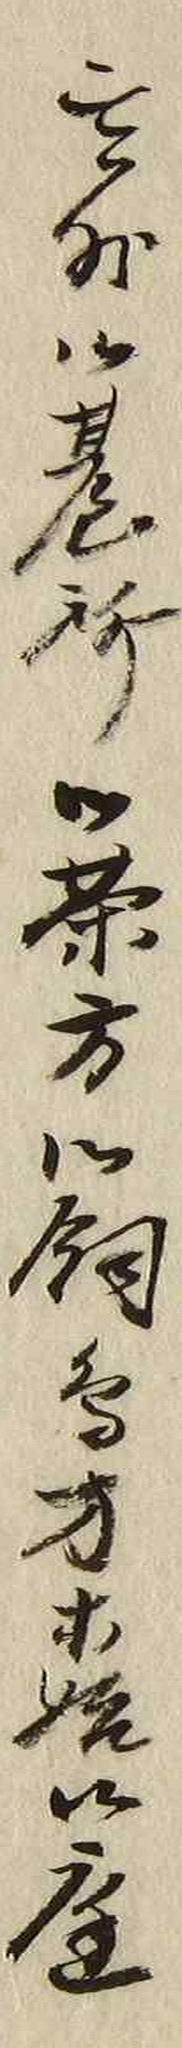其外御台所御茶方御飼鳥方等始御庭
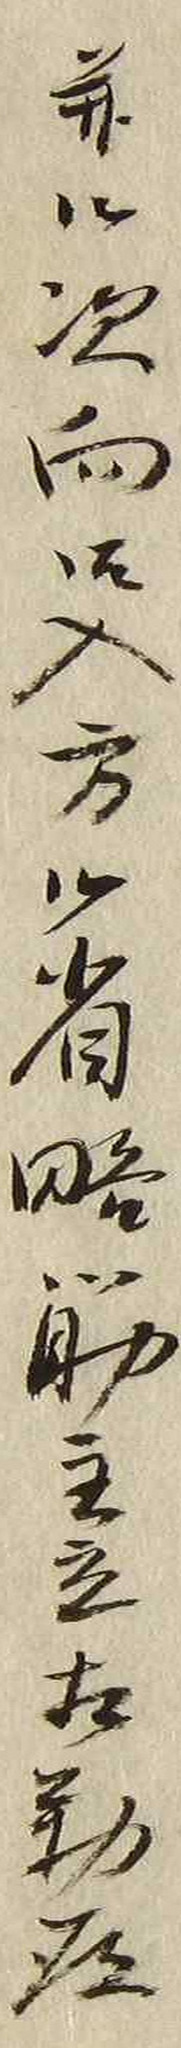并御次向御入方御省略筋主立相勤存
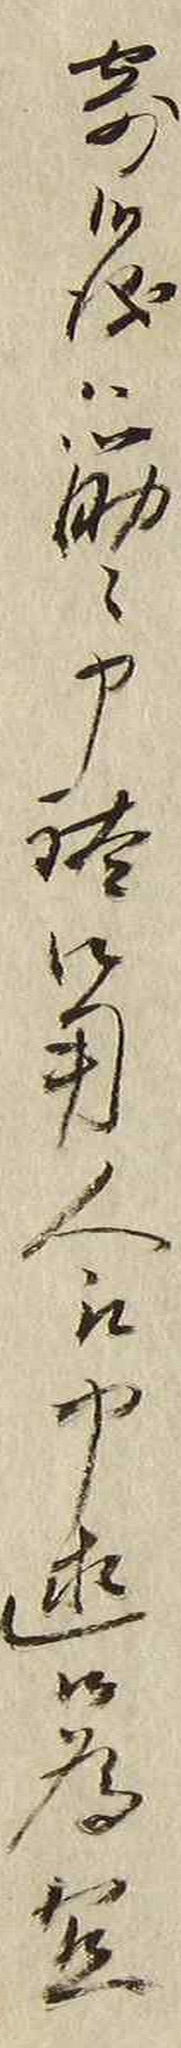寄候儀ハ筋々申談御用人江申述御為宜

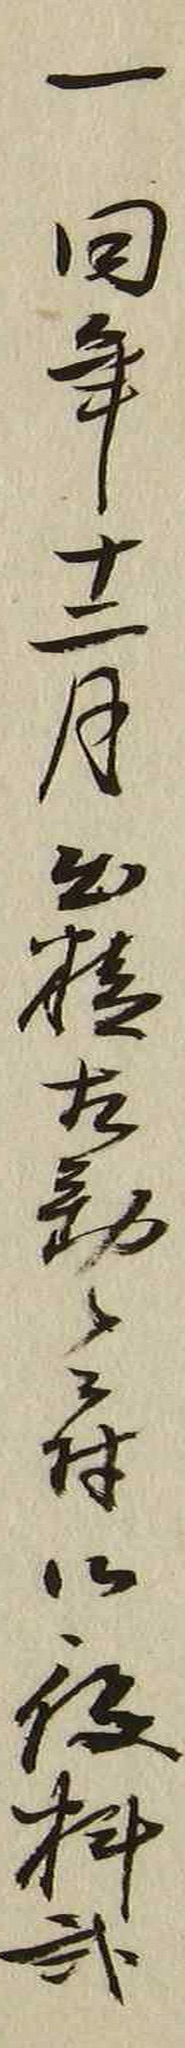一同年十二月出精相勤候ニ付御役料弐
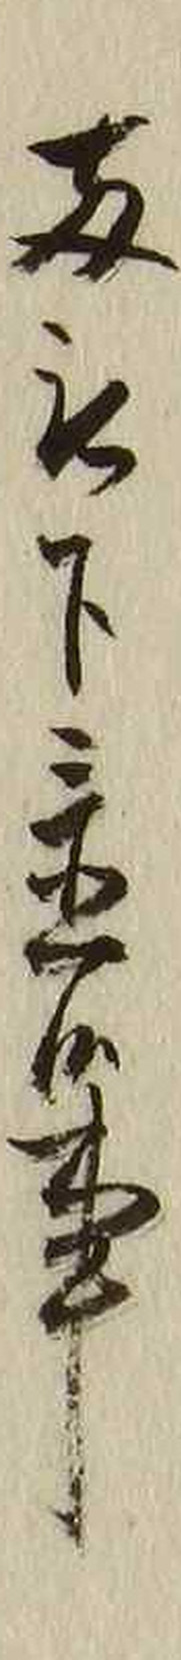両被下置候事
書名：諸士系譜　巻之345　も之部1
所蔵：会津若松市立会津図書館
